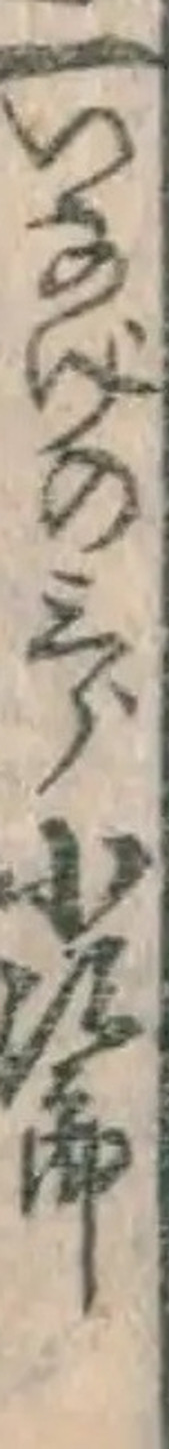いなげの三郎小次郎
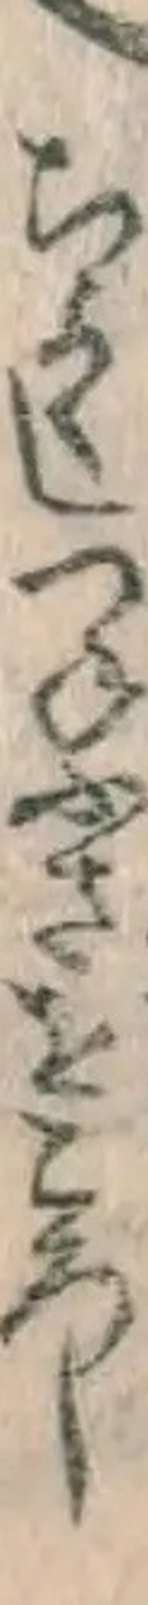ちよくしつねふさをころし
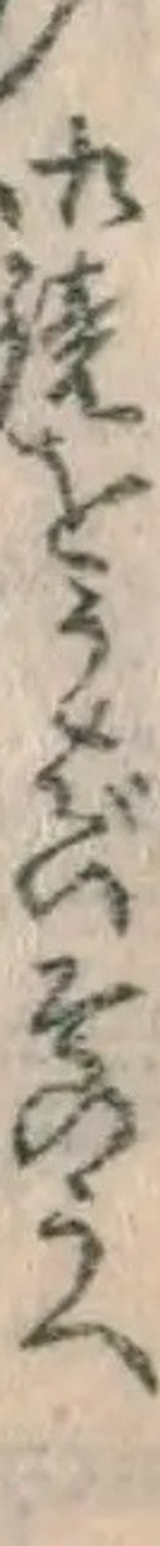御鏡をうばいそのうへ
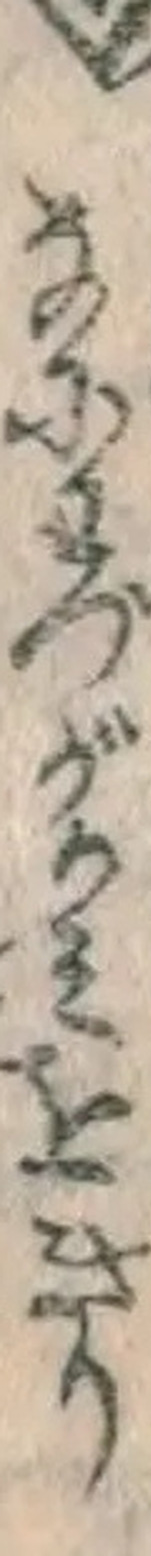なにわづがかみをきり
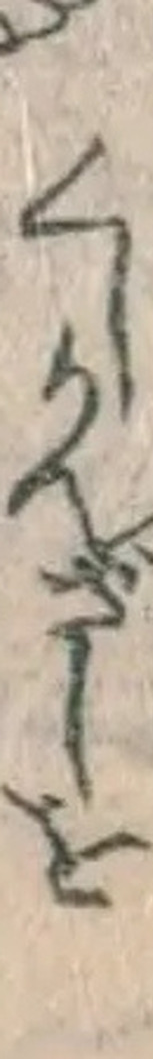くしかんざしを
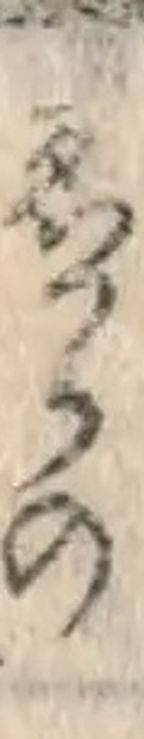ゑからの
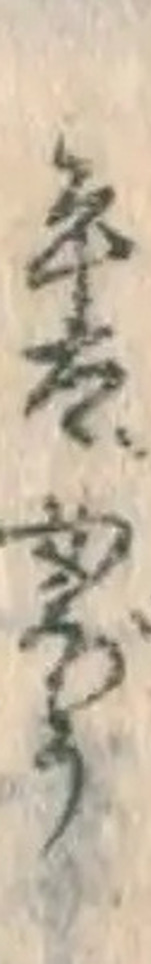平太女ぼう
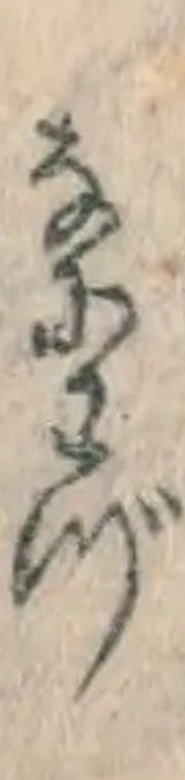なにわづ
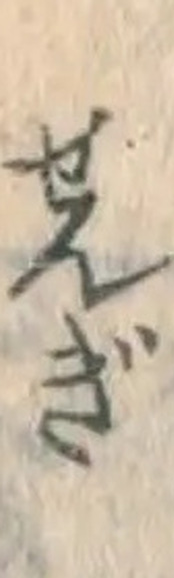せんぎ
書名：開増梅[カチドキ]
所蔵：国立国会図書館 National Diet Library, JAPAN
